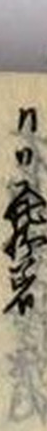同日飛脚着
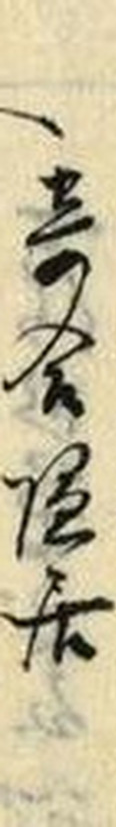寄合隠居
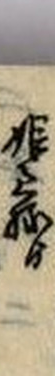姫君様ゟ
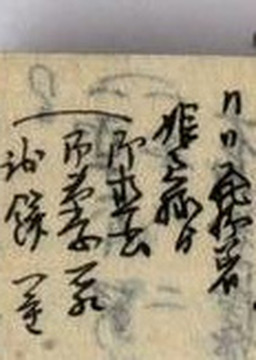御直書
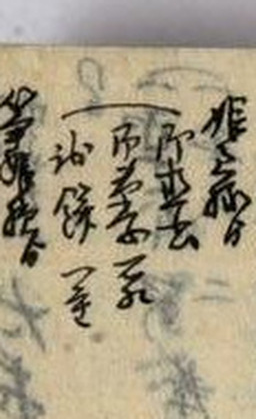御菓子一箱
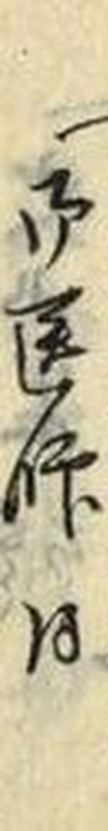御医師同
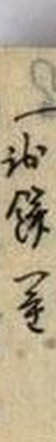氷餅一重
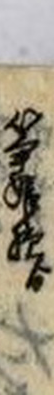箏姫様ゟ
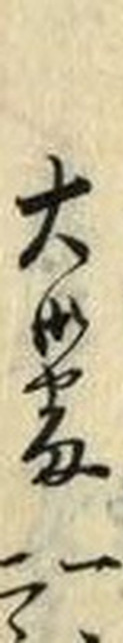大御番
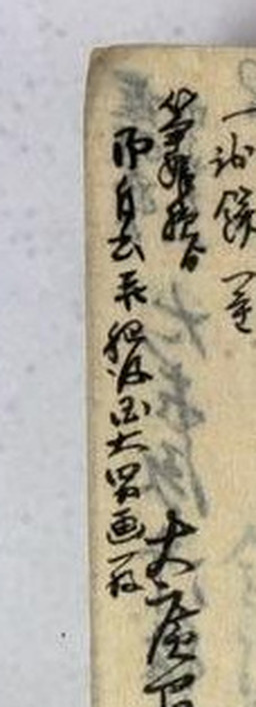御自書并肥後国大男画一枚

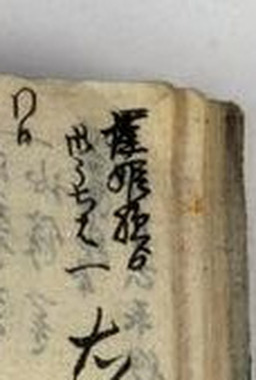謹姫様ゟ
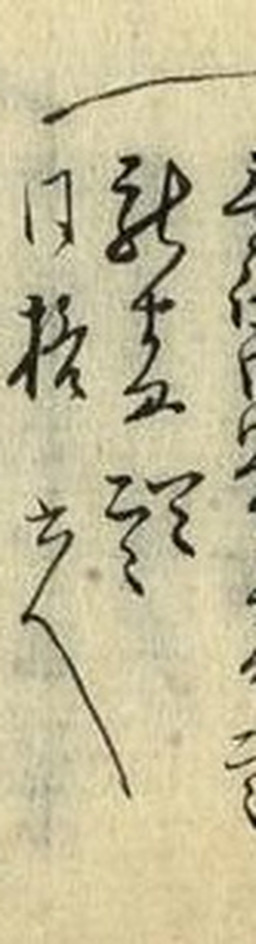同格六人
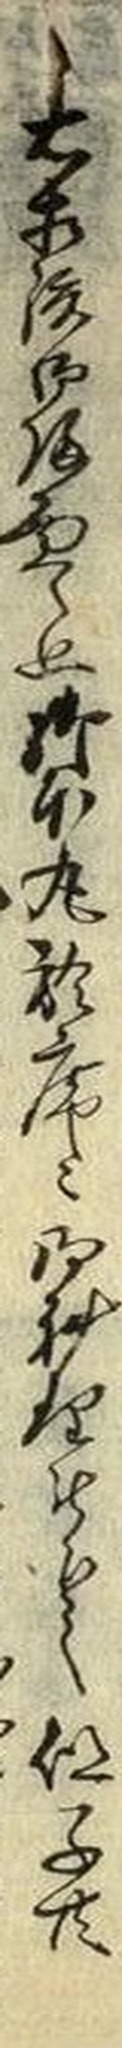右相済御帰殿之上御本丸於席ニ御料理被下之但子共
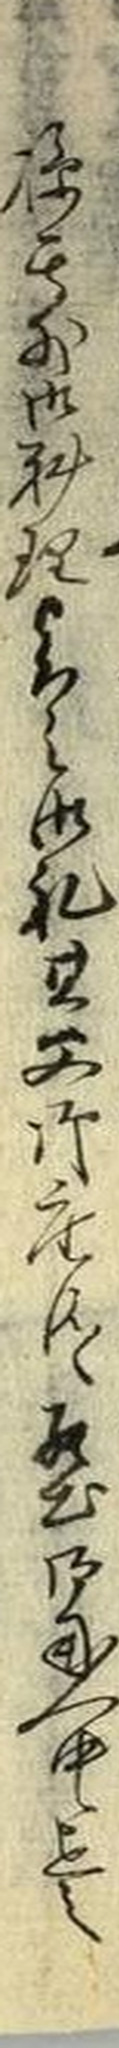孫其外御料理被下之御礼其父御座所へ罷出御用人中へ申上之
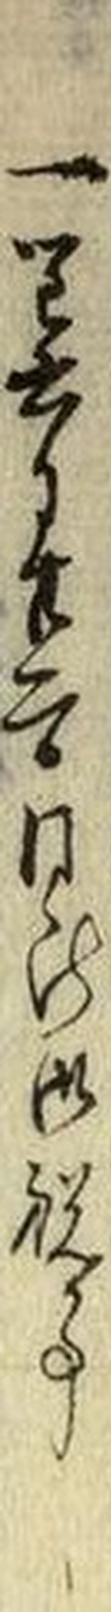一閏六月廿二日同断御祝事
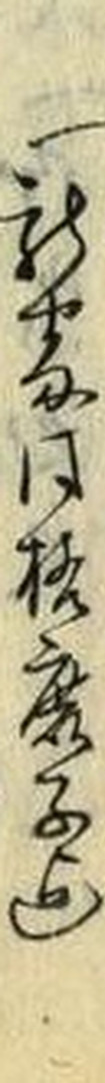新番同格庶子迄
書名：少傅日録抄（斉承付側向頭取日記、在国）
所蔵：福井県文書館 Fukui Prefectural Archives
